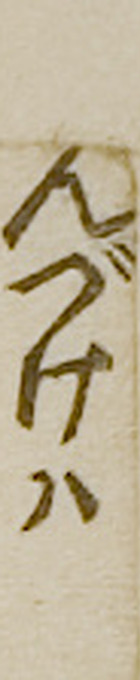んづけハ
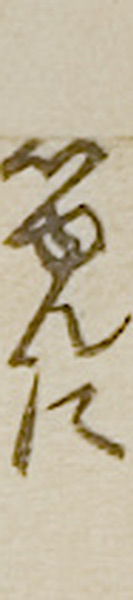しゆんに
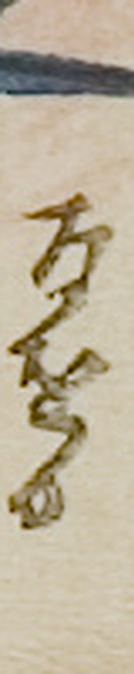なをる
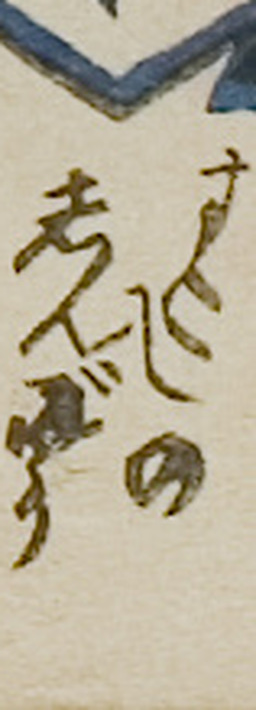しんぼう
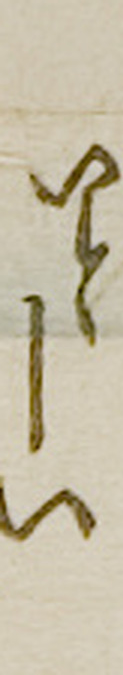いとしい
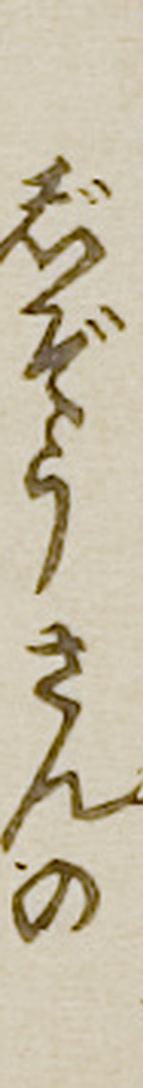ぢぞうさんの
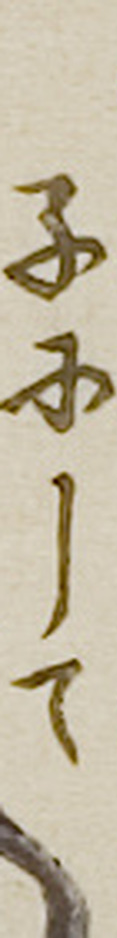子にして
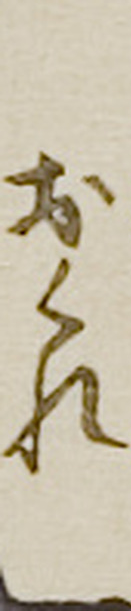おくれ
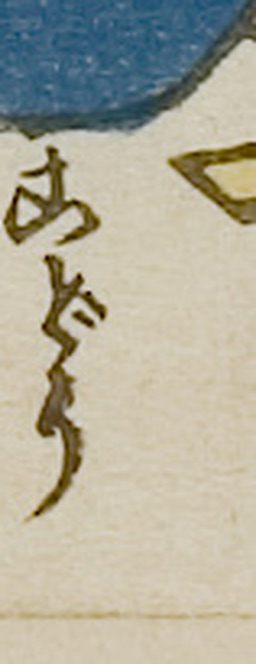こどう
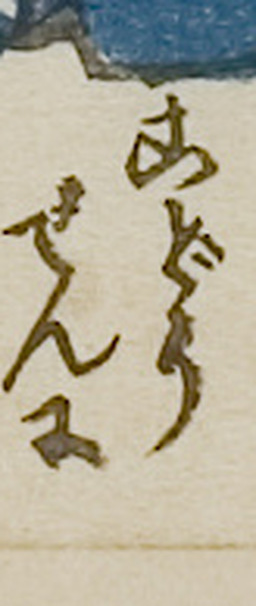でんに
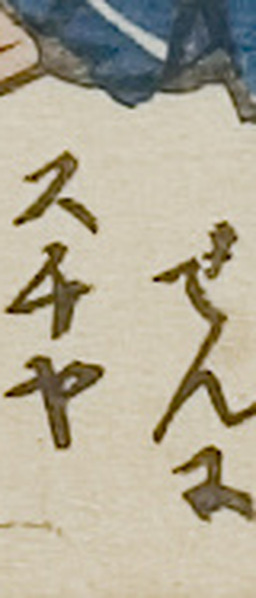スチヤ
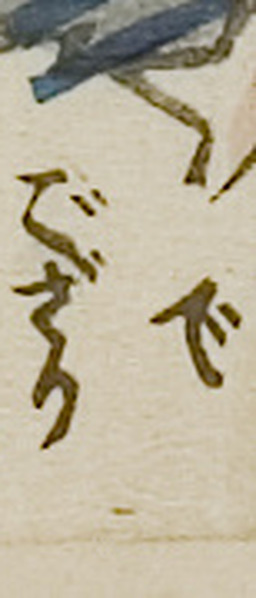ござり
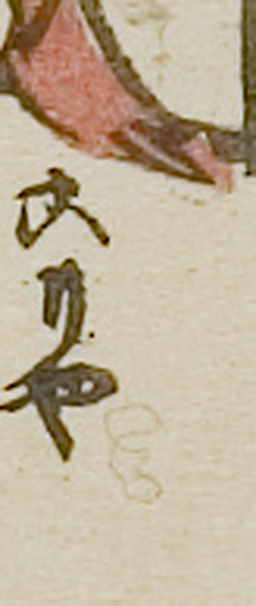こりや
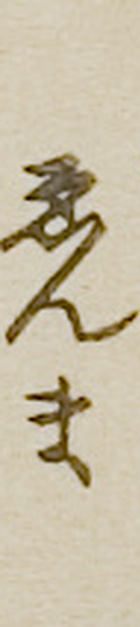えんま
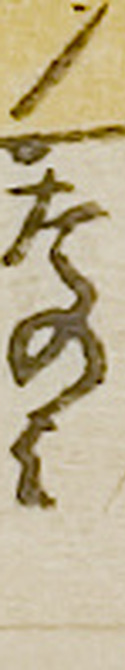たのみ
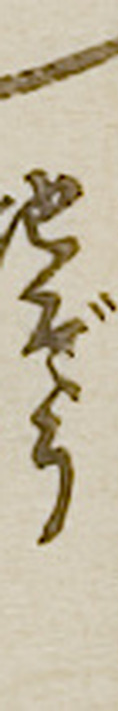地ぞう
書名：地震冥途ノ図
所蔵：東京大学総合図書館 General Library in the University of Tokyo, JAPAN
